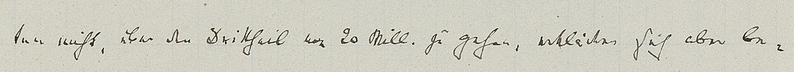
ten nicht, über den Drittheil von 20 Mill. zu gehen, erklärten sich aber be-
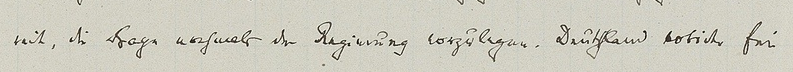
reit, die Frage nochmals der Regierung vorzulegen. Deutschland votirte für
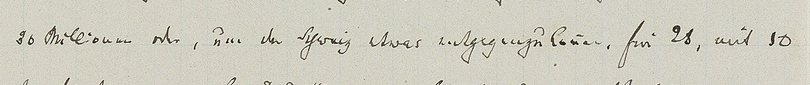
30 Millionen oder, um der Schweiz etwas entgegenzukommen, für 28, mit 10
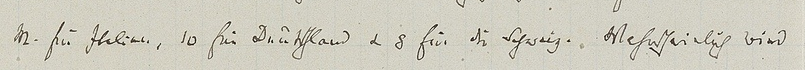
M. für Italien, 10 für Deutschland & 8 für die Schweiz. Wahrscheinlich wird
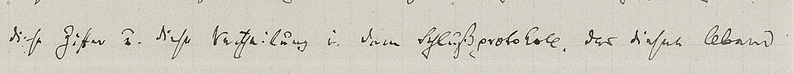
diese Ziffer u. diese Vertheilung in dem Schlußprotokoll, das diesen Abend
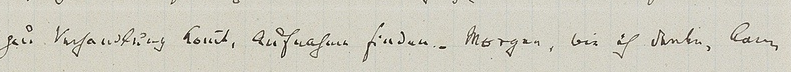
zur Versammlung kommt, Aufnahme finden. – Morgen, wie ich denke, kann
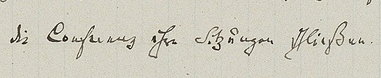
die Conferenz ihre Sitzungen schließen.
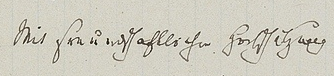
Mit freundschaftlicher Hochschätzung
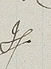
J.
